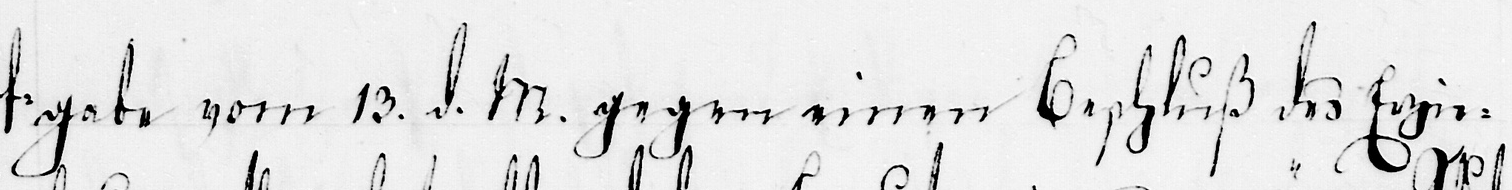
gabe vom 13. d. M. gegen einen Beschluß des Erzie¬
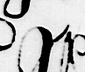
den
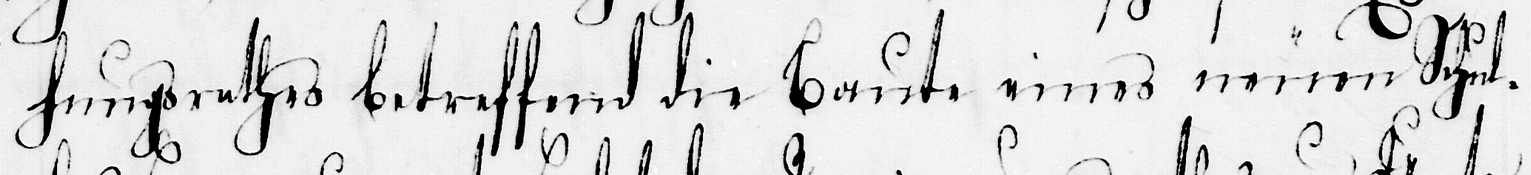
hungsrathes betreffend die Baute eines neuen Schul¬
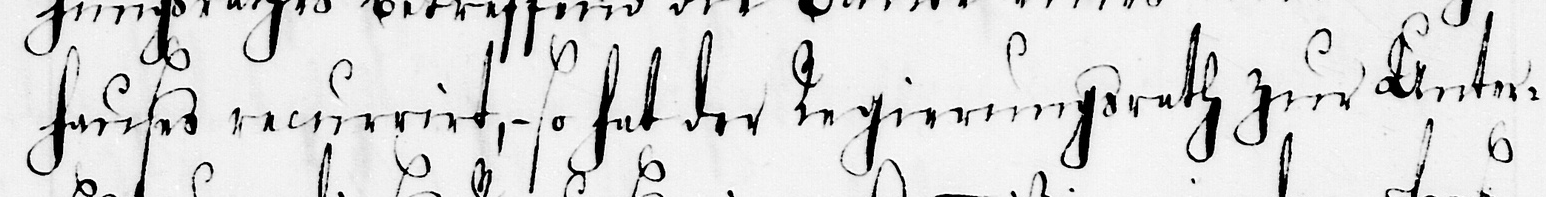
hauses recurrirt, – so hat der Regierungsrath zur Unter¬
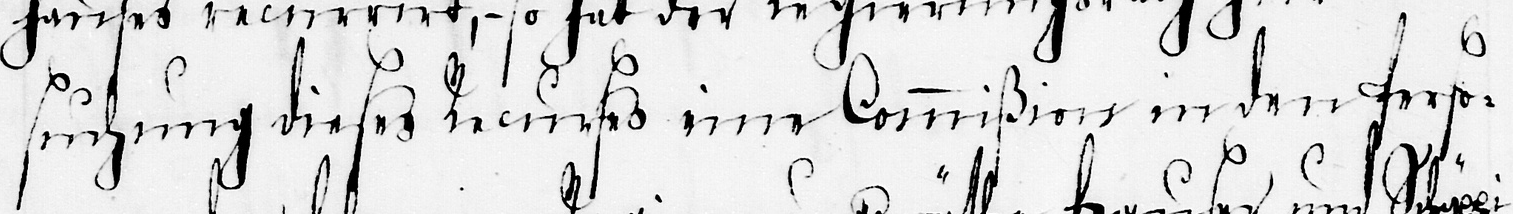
suchung dieses Recurses eine Commißion in den Perso¬
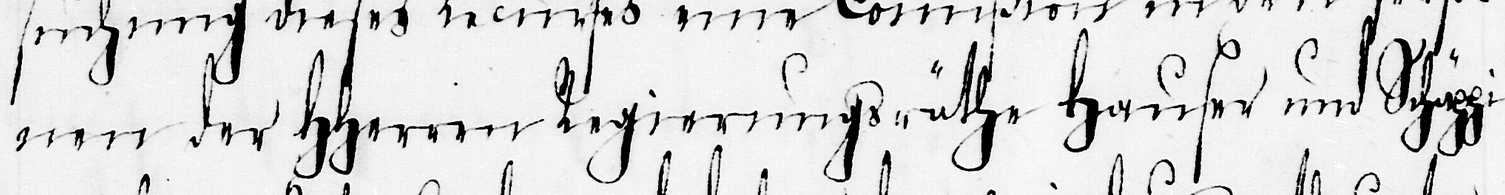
nen der HHerren Regierungsräthe Hauser und Schäp¬
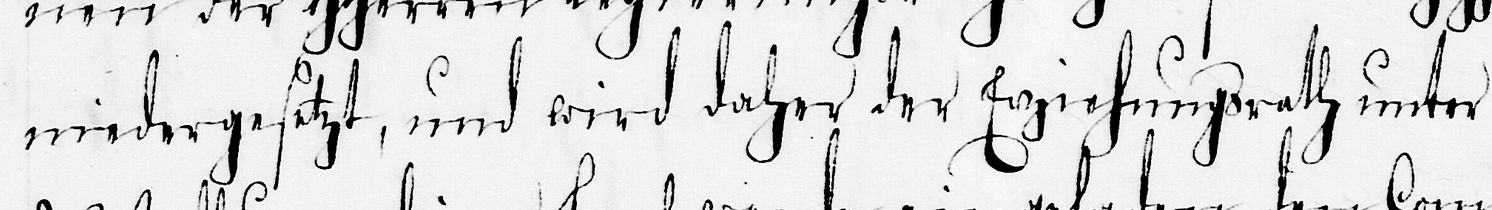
niedergesetzt, und wird daher der Erziehungsrath unter
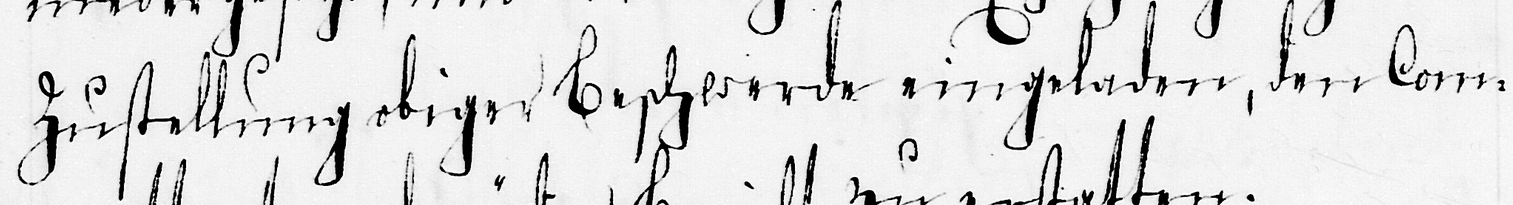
Zustellung obiger Beschwerde eingeladen, den Com¬
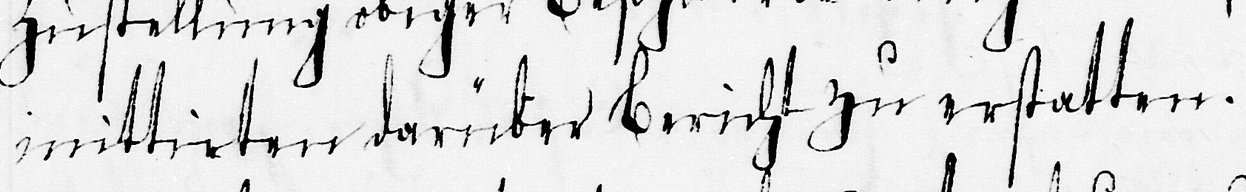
mittirten darüber Bericht zu erstatten.
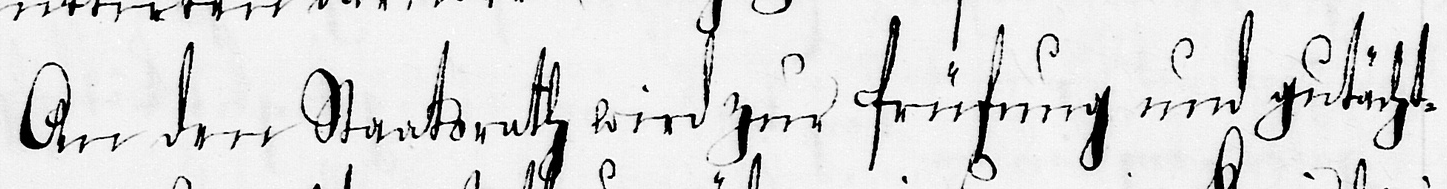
An den Staatsrath wird zur Prüfung und gutächt¬
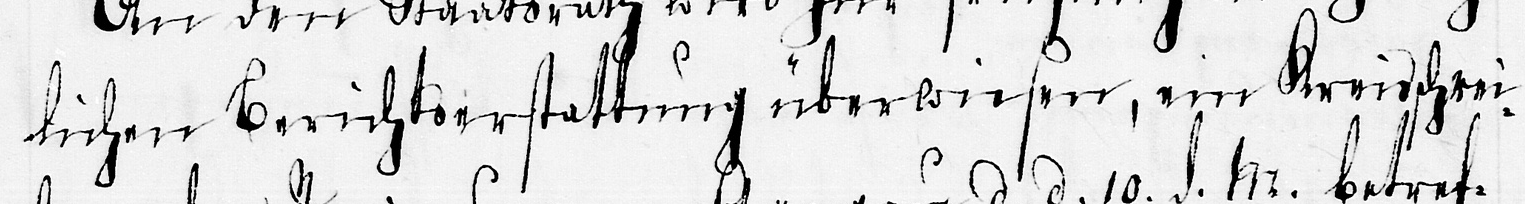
lichen Berichtserstattung überwiesen, ein Kreisschrei¬
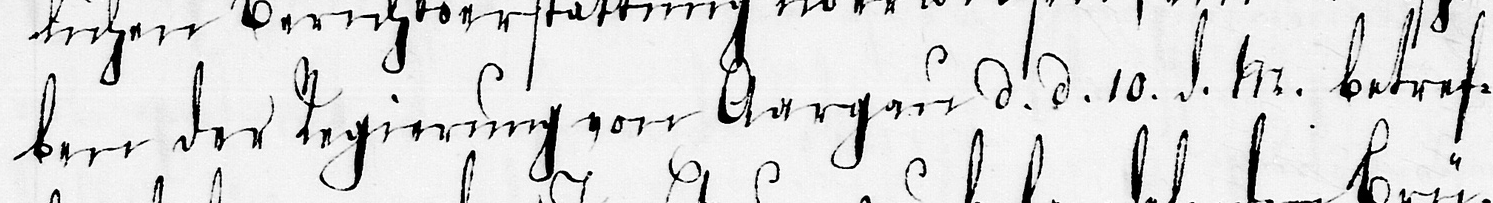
ben der Regierung von Aargau d. d. 10. d. M. betref¬
